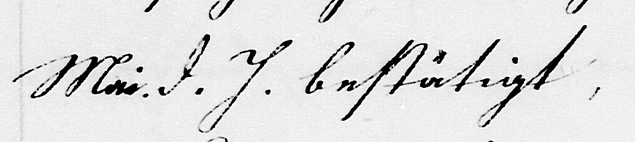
Mai. d. J. bestätigt,
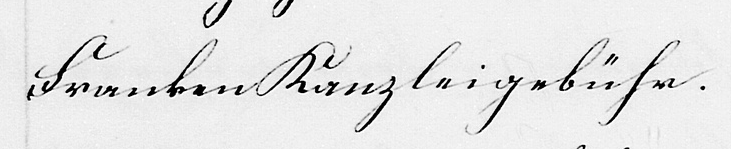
Franken Kanzleigebühr.
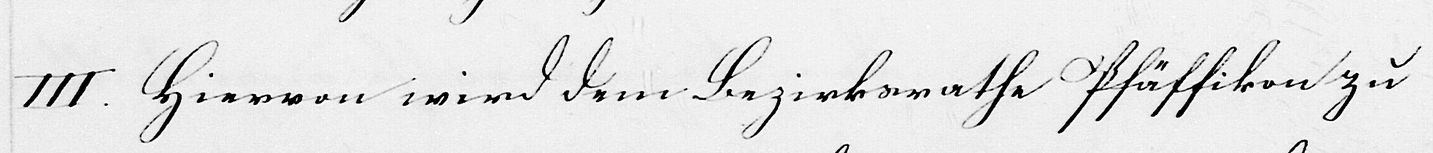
III. Hiervon wird dem Bezirksrathe Pfäffikon zu
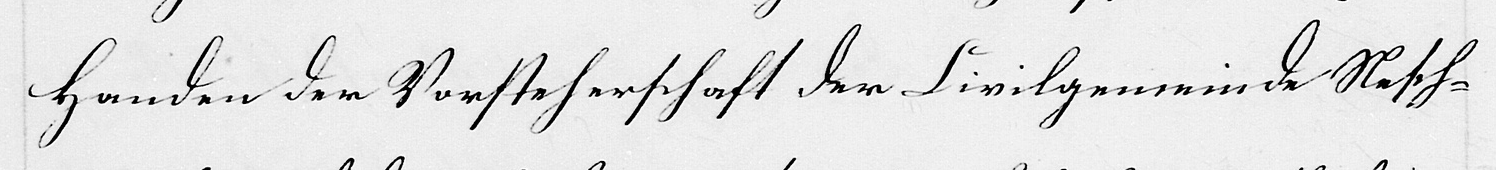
Handen der Vorsteherschaft der Civilgemeinde Nesch¬
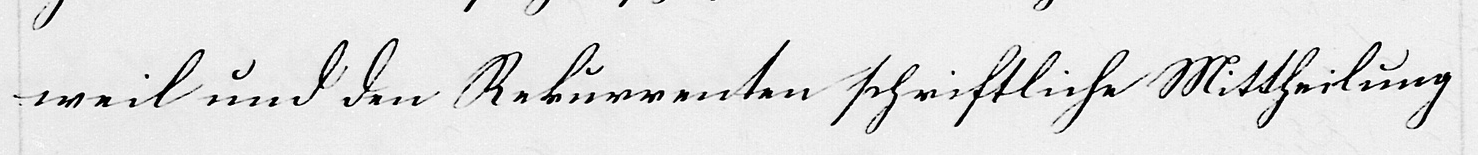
weil und den Rekurrenten schriftliche Mittheilung
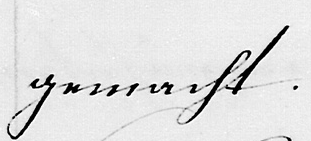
gemacht.
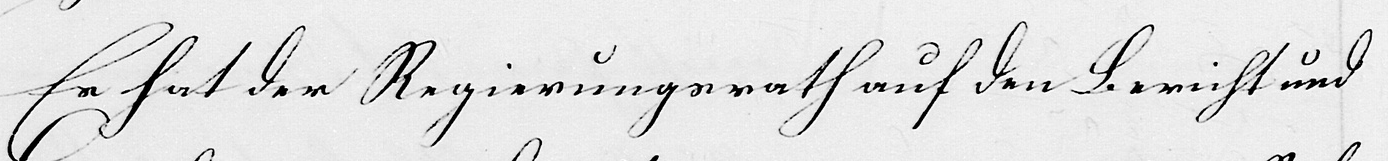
Es hat der Regierungsrath auf den Bericht und
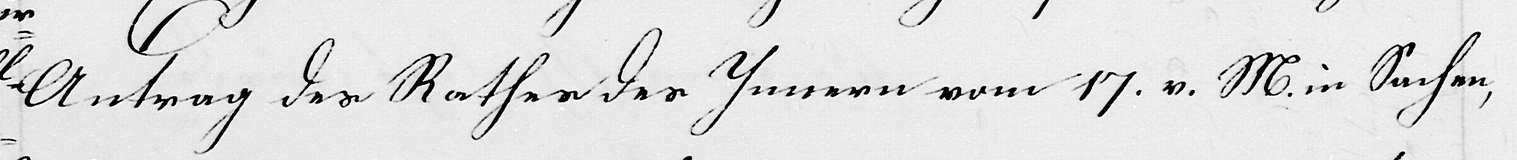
Antrag des Rathes des Innern vom 17. v. M. in Sachen,
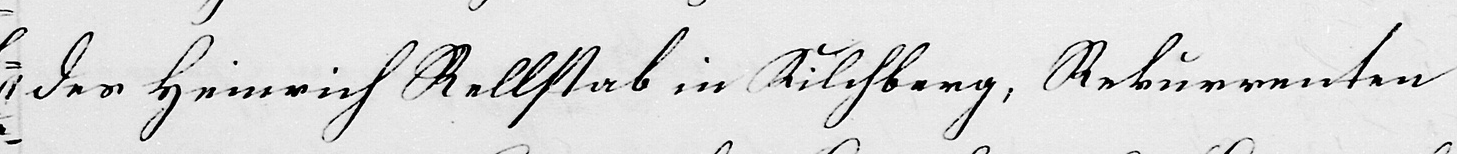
des Heinrich Rellstab in Kilchberg, Rekurrenten
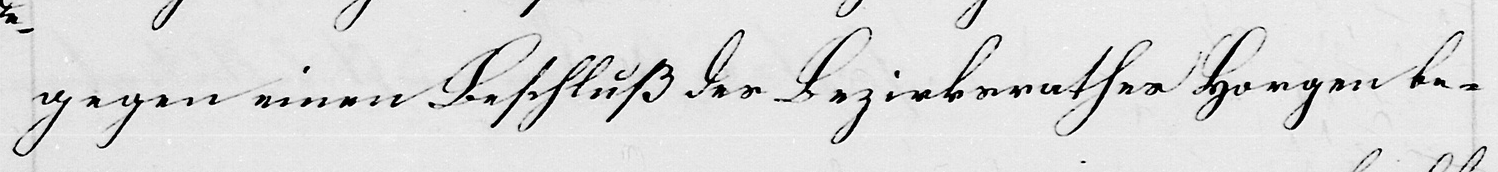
gegen einen Beschluß des Bezirksrathes Horgen be-
